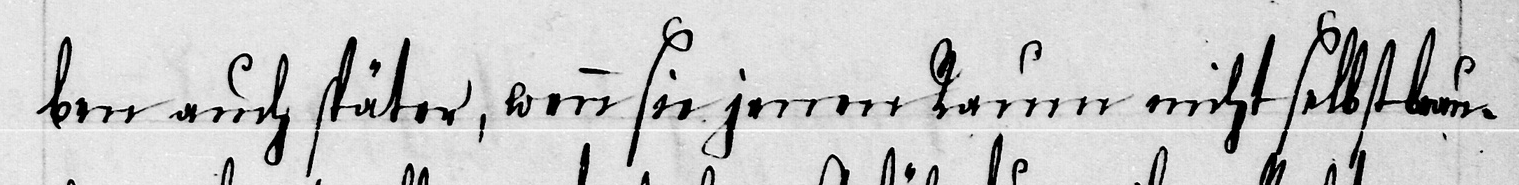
ben auch später, wenn sie jenen Raum nicht selbst brau¬
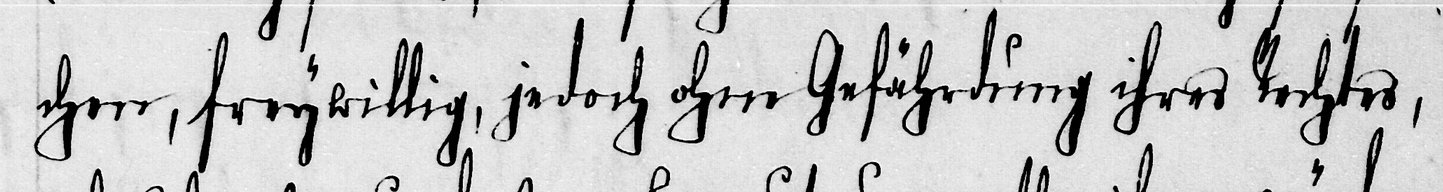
chen, freywillig, jedoch ohne Gefährdung ihres Rechte,
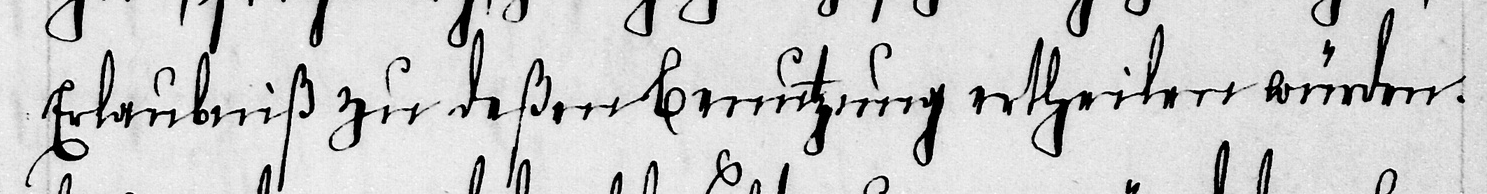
Erlaubniß zu deßen Benutzung ertheilen würden.
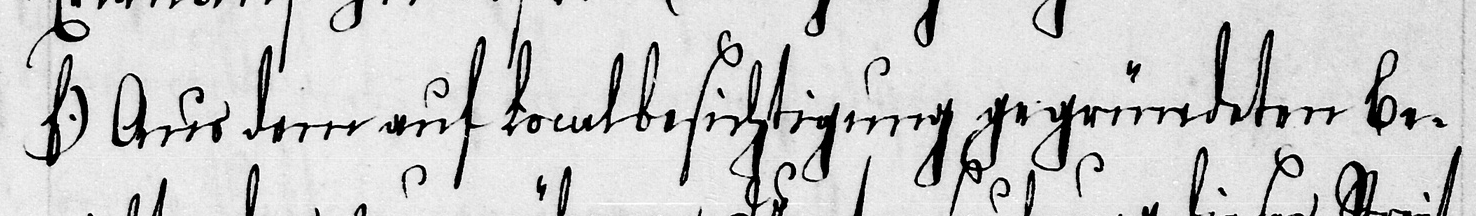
f.) Aus dem auf Localbesichtigung gegründeten Be¬
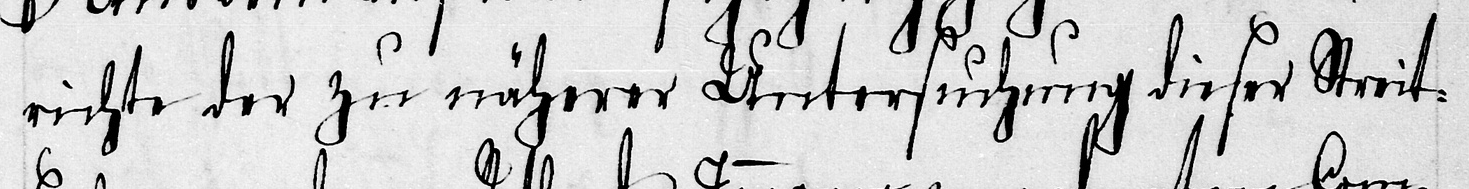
richte der zu näherer Untersuchung dieser Streit¬
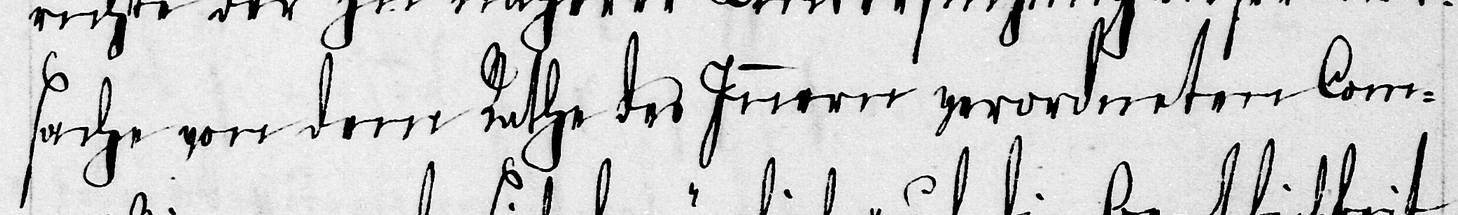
sache von dem Rathe des Innern verordneten Com¬
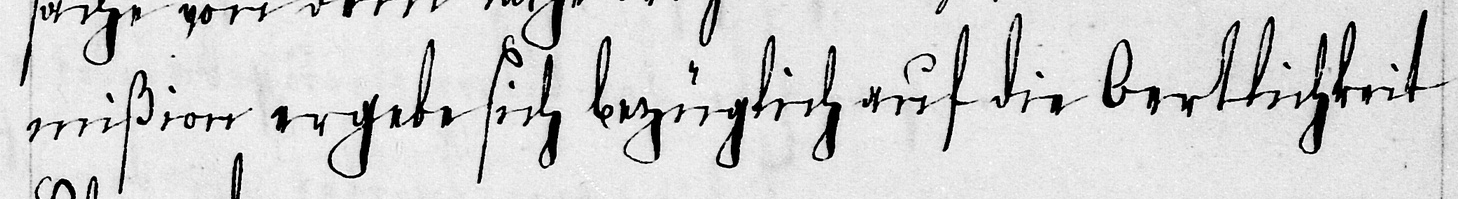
mißion ergebe sich bezüglich auf die Oertlichkeit
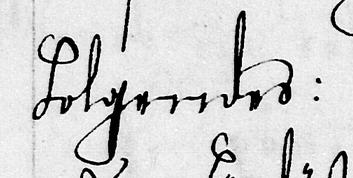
Folgendes:
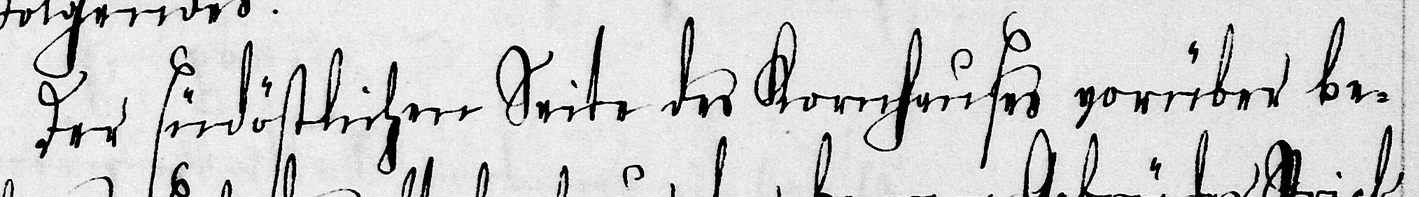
Der südöstlichen Seite des Kornhauses vorüber be¬
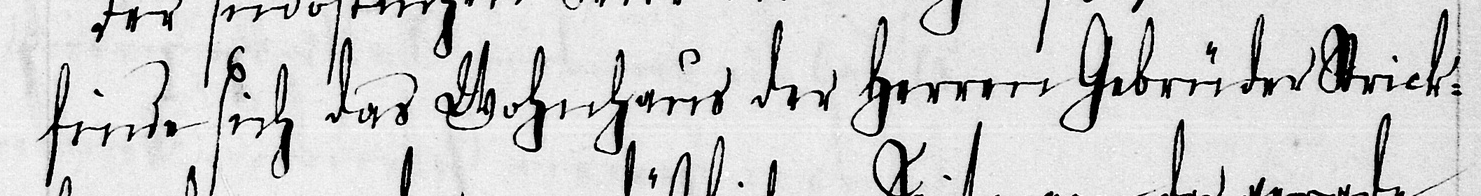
finde sich das Wohnhaus der Herren Gebrüder Strick¬
